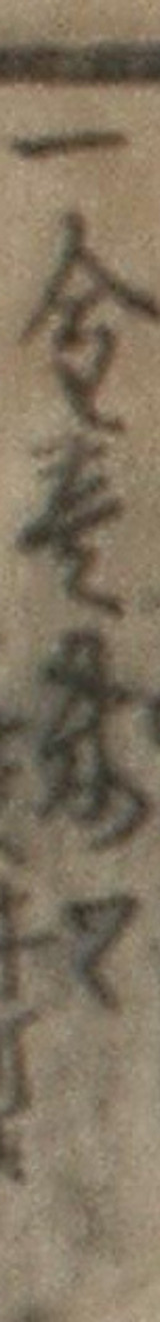一金一朱ツゝ
